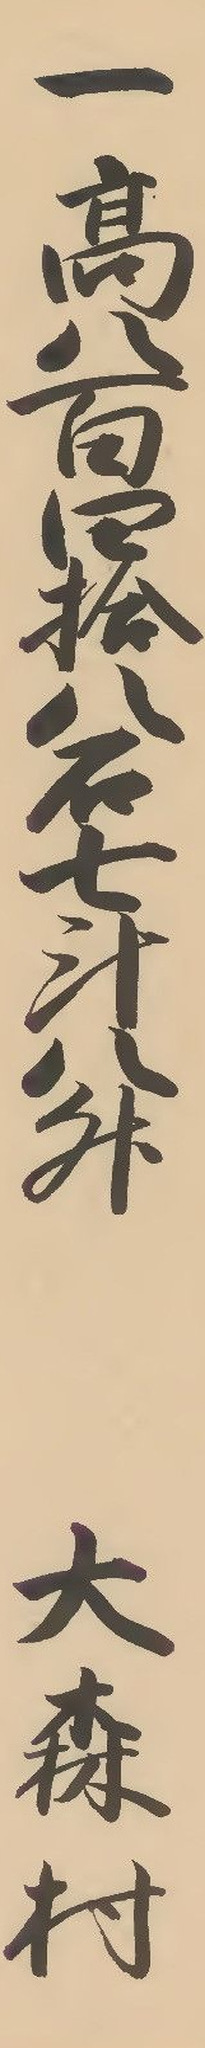一高八百四拾八石七斗八升大森村

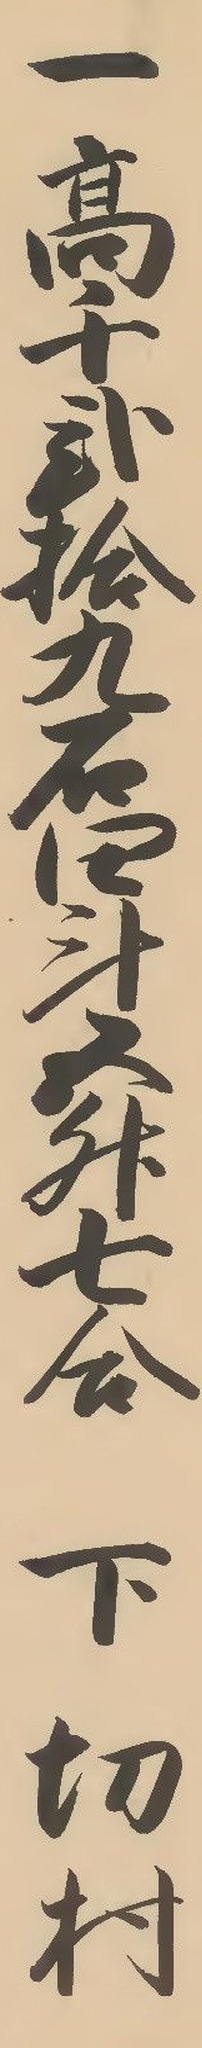一高千弐拾九石四斗五升七合下切村
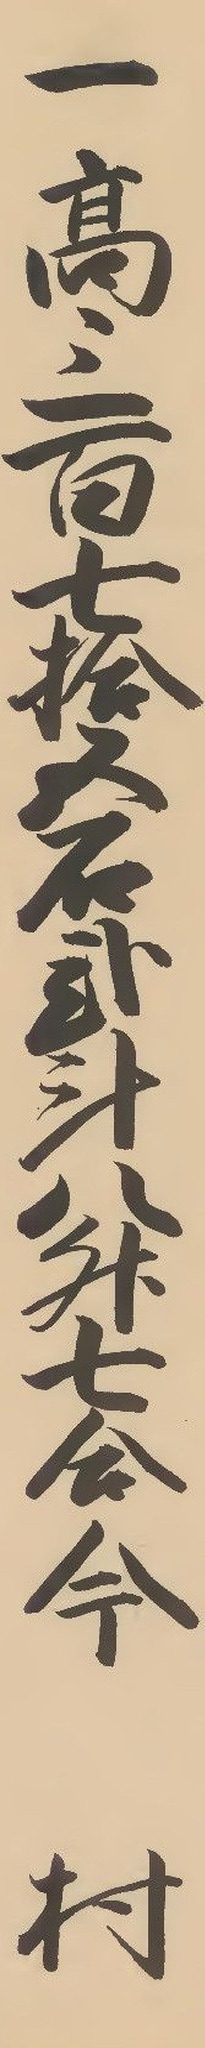一高三百七拾五石弐斗八升七合今村
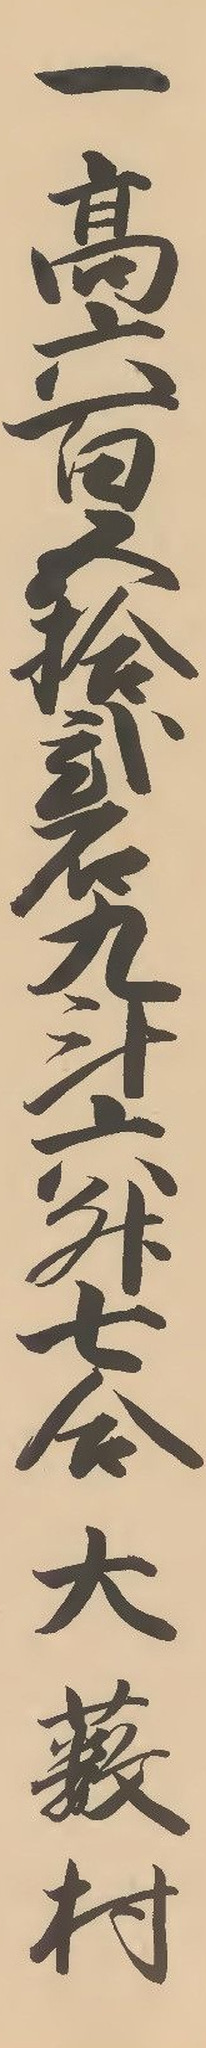一高六百五拾弐石九斗六升七合大薮村
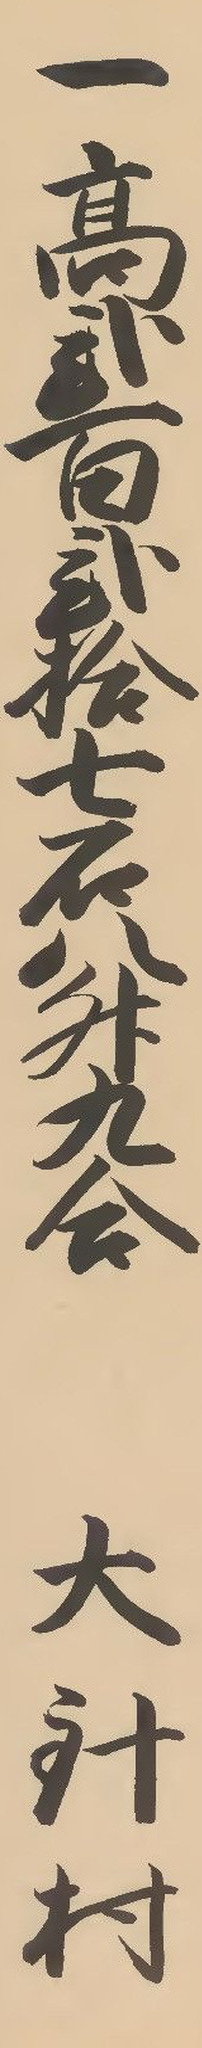一高弐百弐拾七石八升九合大針村
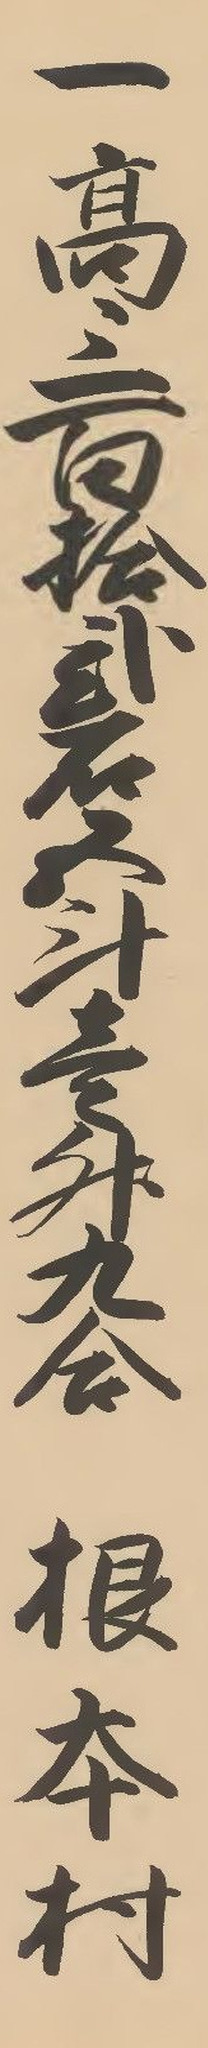一高三百拾弐石五斗壱升九合根本村
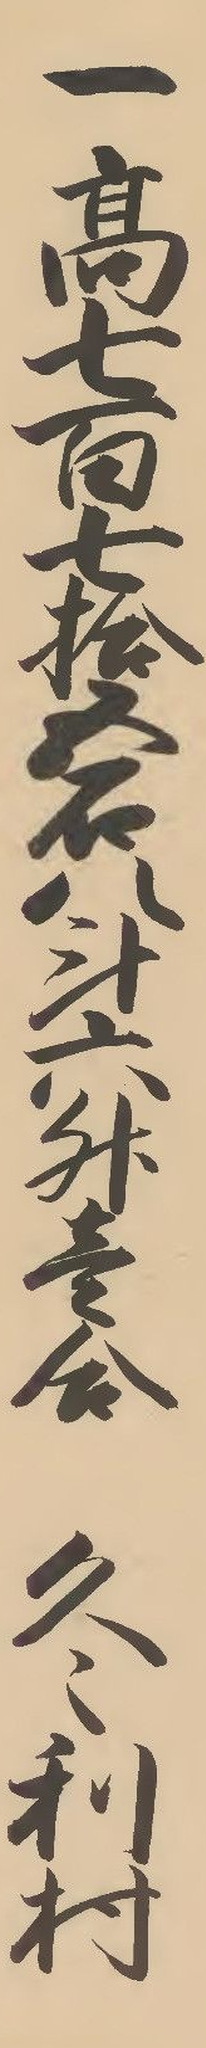一高七百七拾五石八斗六升壱合久々利村

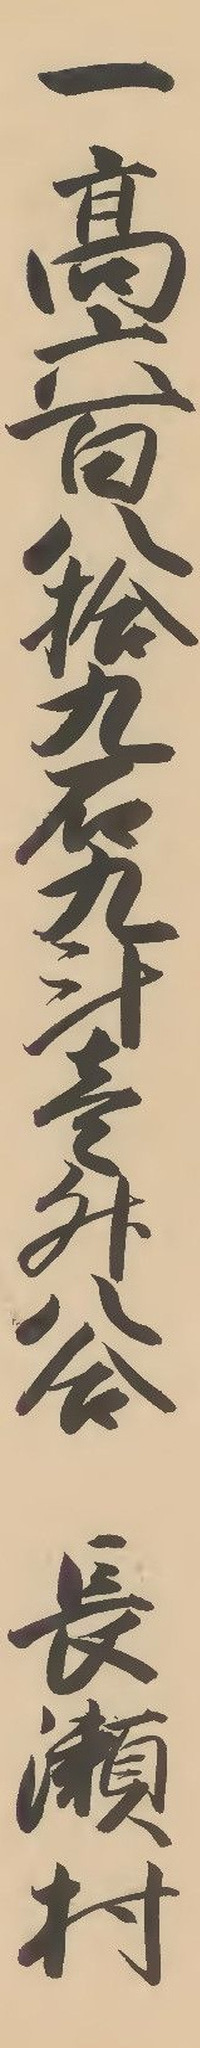一高六百八拾九石九斗壱升八合長瀬村

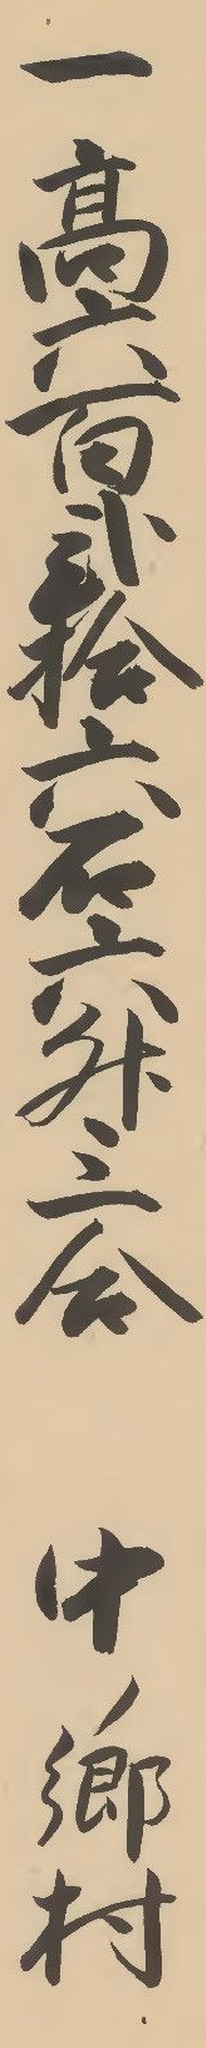一高六百弐拾六石六升三合中ノ郷村
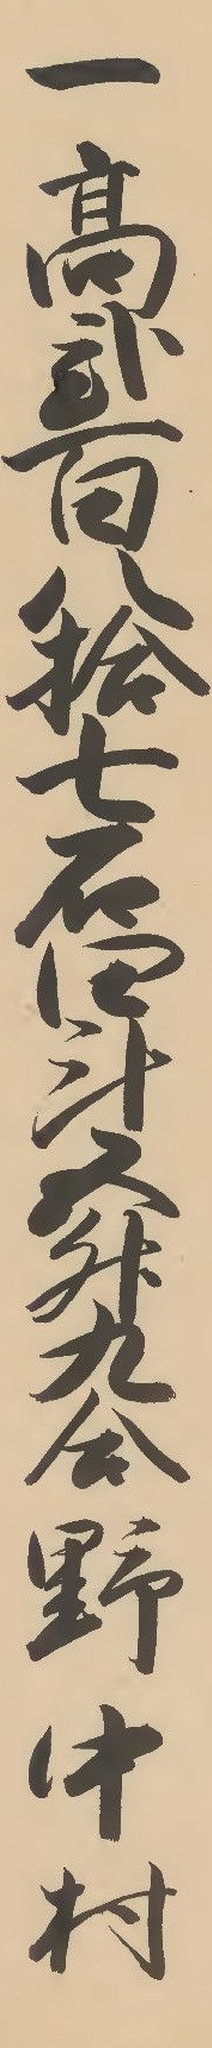一高弐百八拾七石四斗五升九合野中村
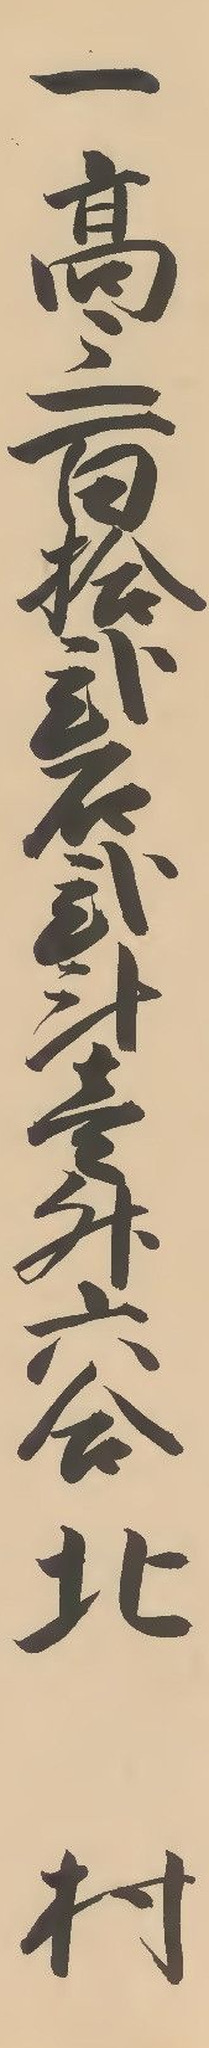一高三百拾弐石弐斗壱升六合北村
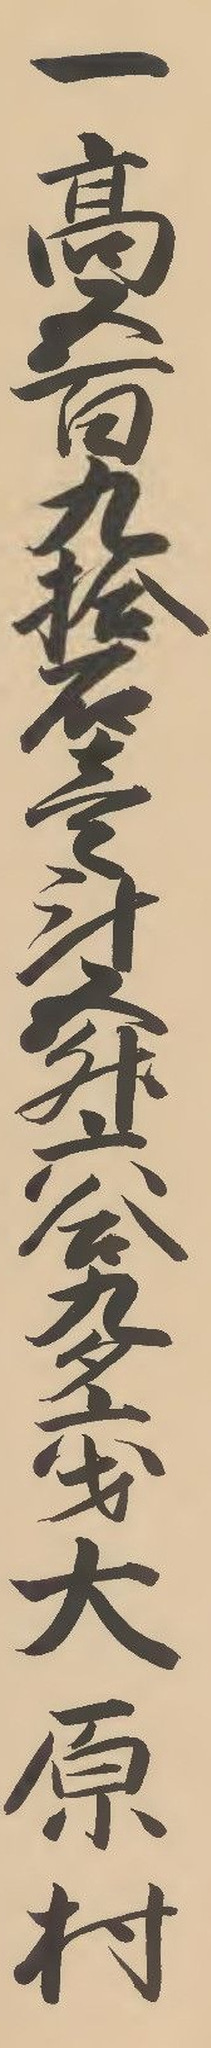一高五百九拾石壱斗五升六合九勺六才大原村

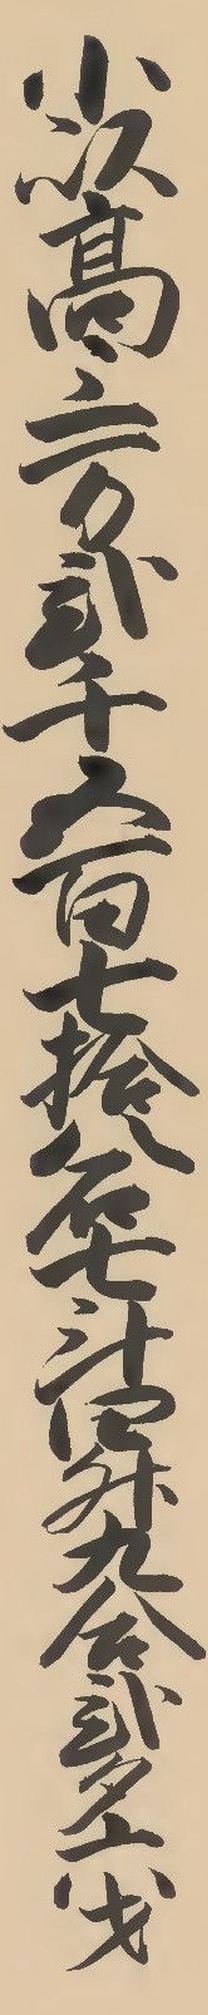小以高三万弐千五百七拾八石七斗四升九合弐勺六才
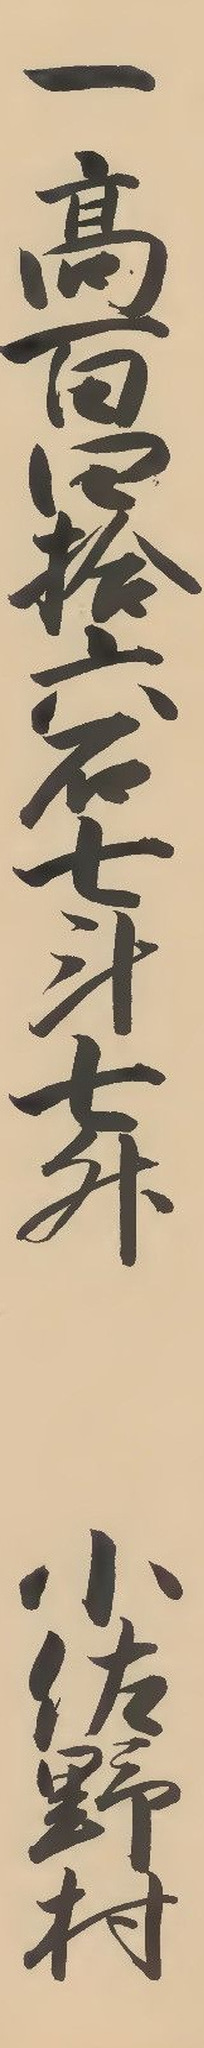一高百四拾六石七斗七升小佐野村
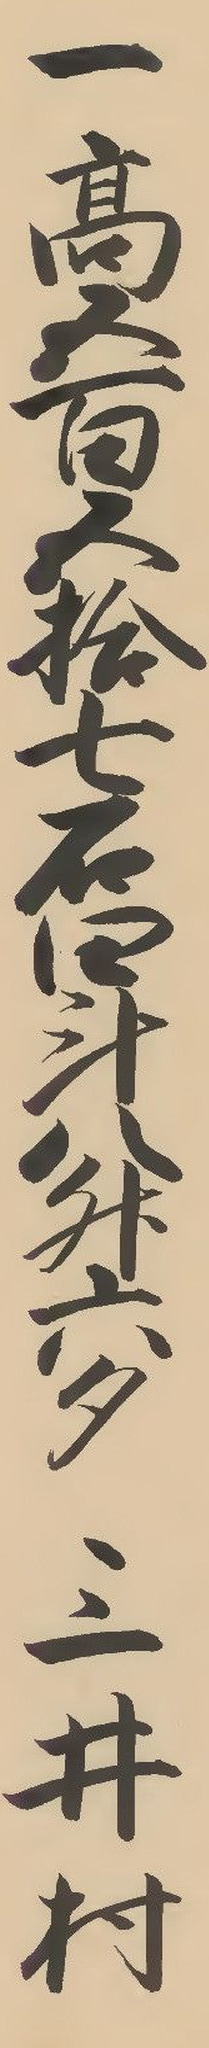一高五百五拾七石四斗八升六勺三井村

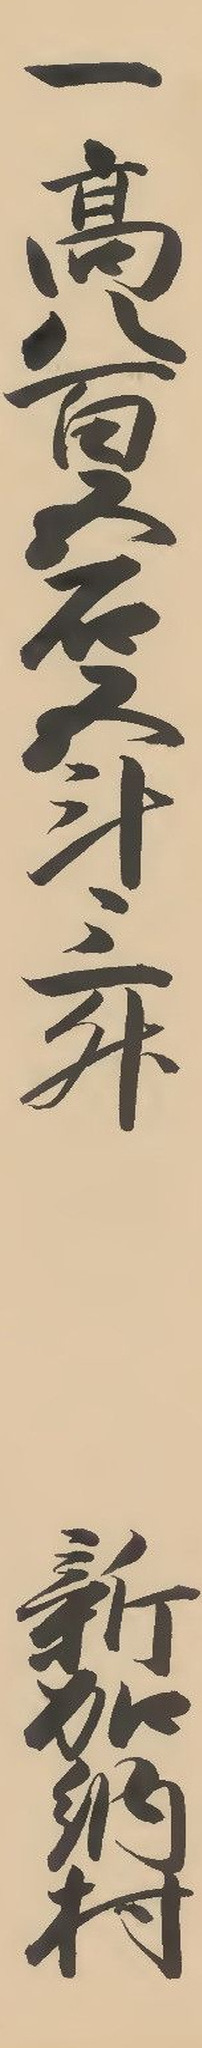一高八百五石五斗三升新加納村
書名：美濃国郷帳
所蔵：国立公文書館 National Archives of Japan
